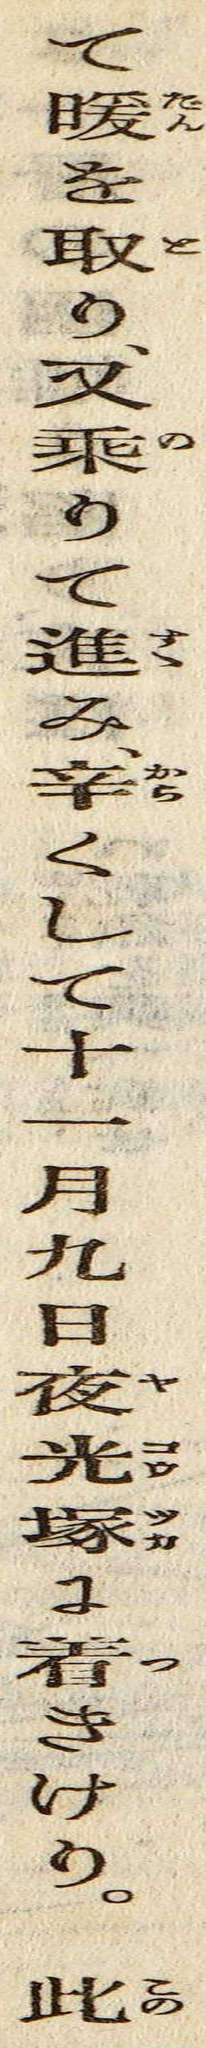て暖を取り、又乗りて進み、辛くして十一月九日夜光塚に着きけり。此
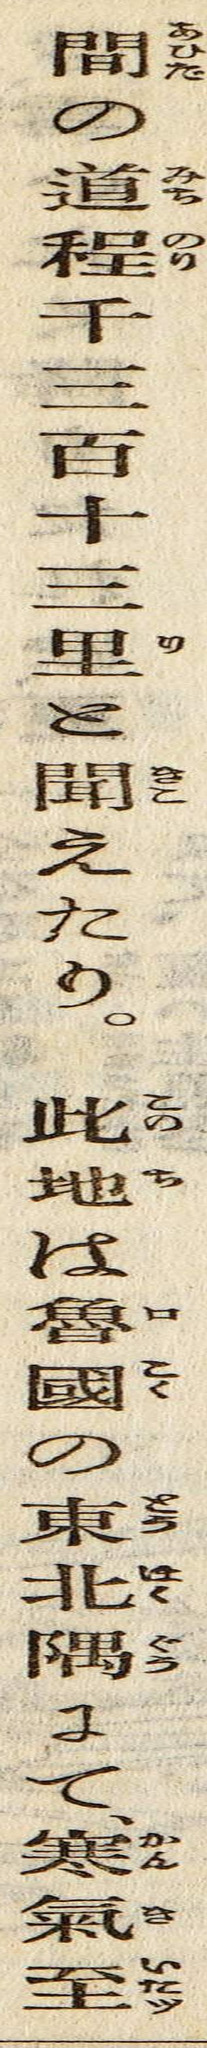間の道程千三百十三里と聞こえたり。此地は魯国の東北隅にて、寒気至
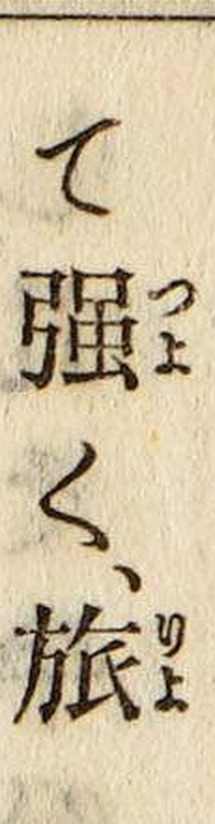て強く、旅
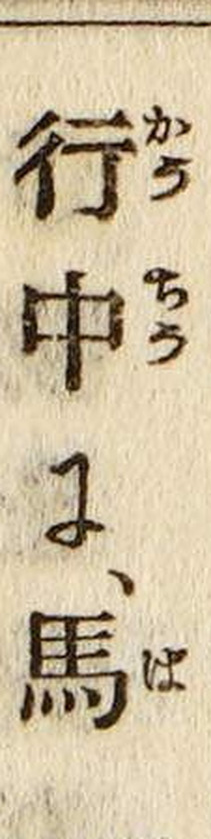行中に、馬
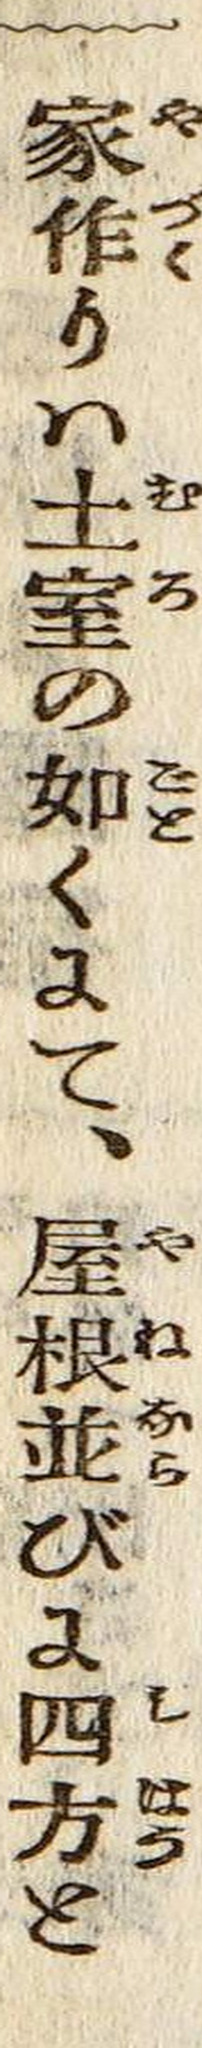家作りは土室の如くに、屋根並び四方と
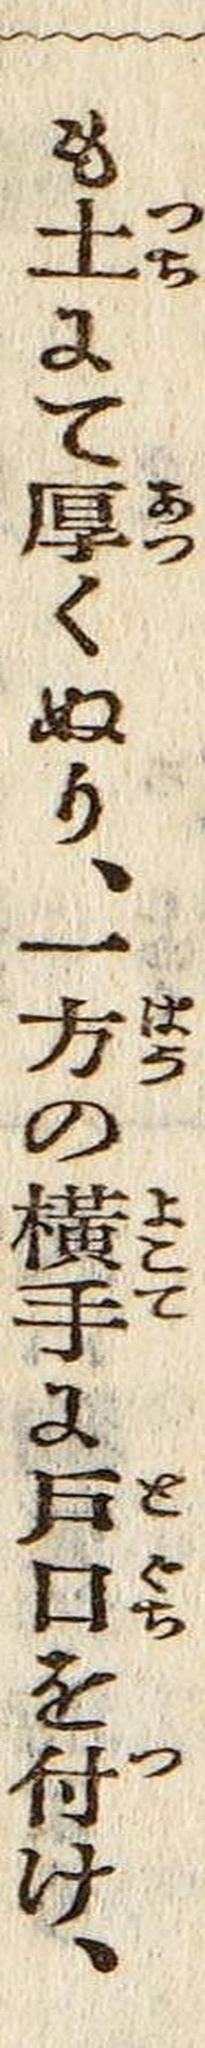も土にて厚くぬり、一方の横手に戸口を付け、
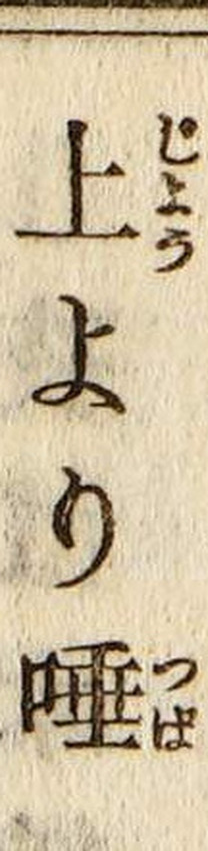上より唾
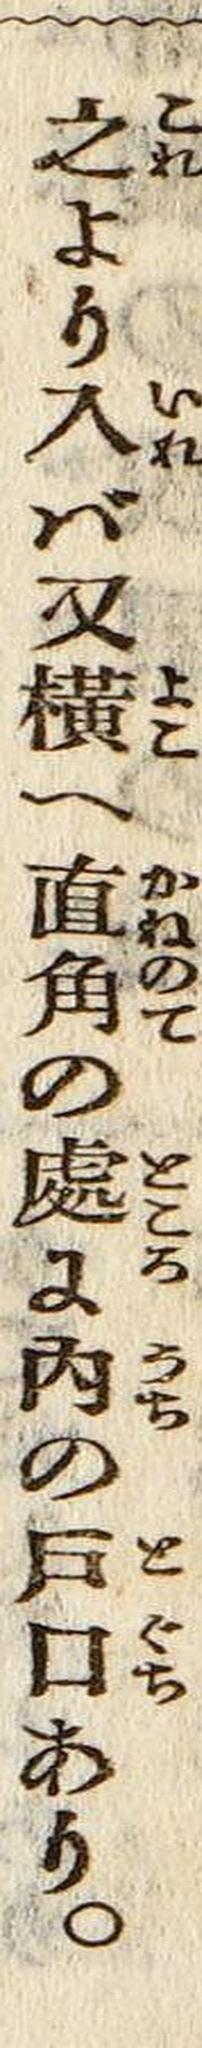之より入ば又横へ直角の処に内の戸口あり。
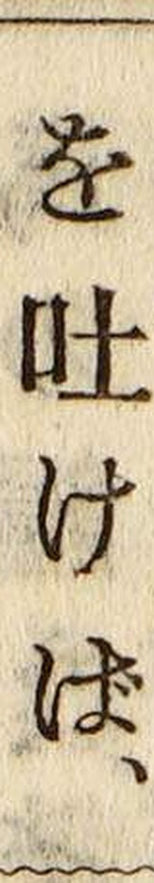を吐けば、
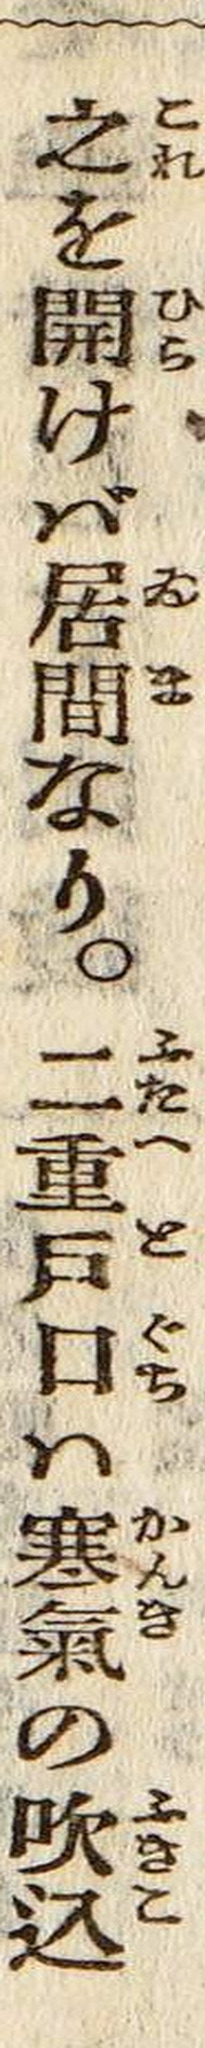之を開けば居間なり。二重戸口は寒気の吹込
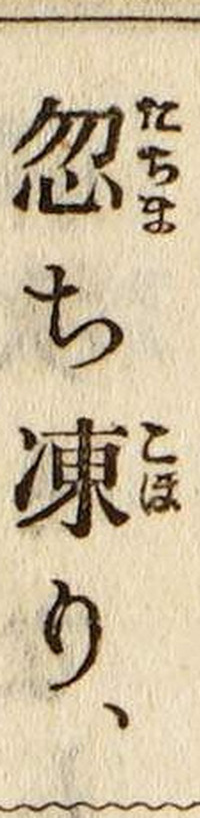忽ち凍り、
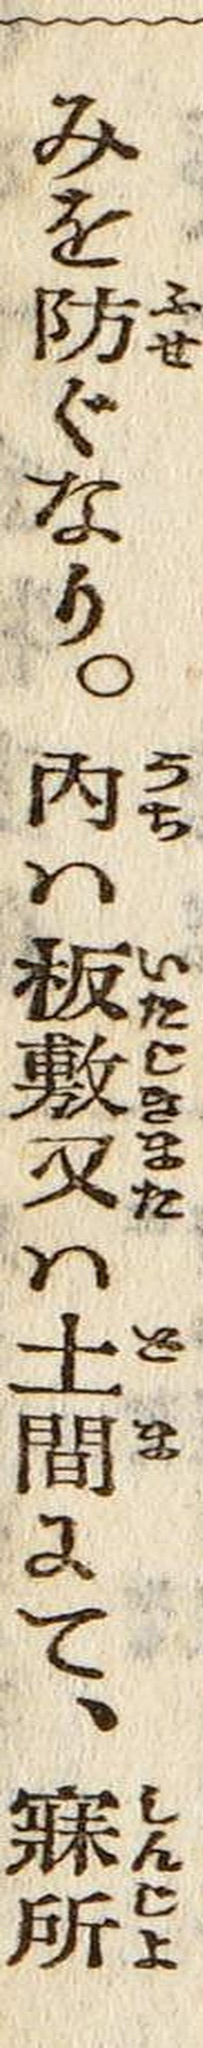みを防ぐなり。内は板敷又ハ土間にて、寝所
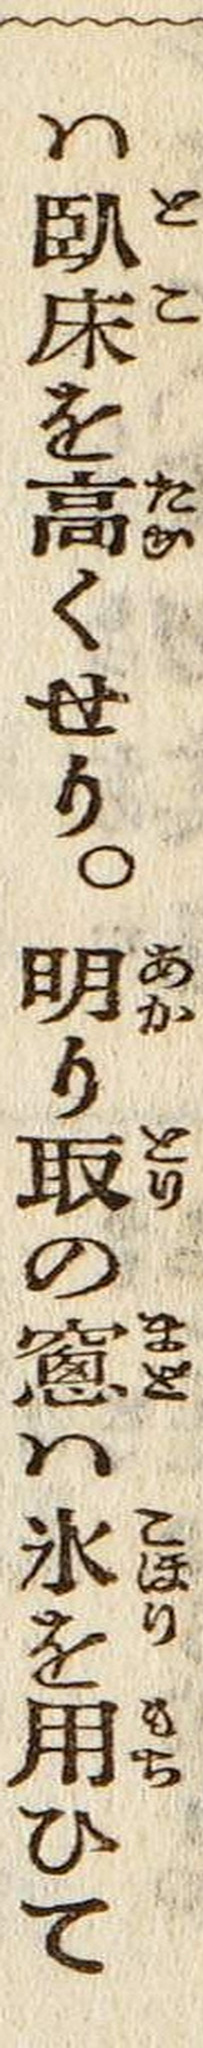は臥床を高くせり。明り取りの窓は氷を用ひて
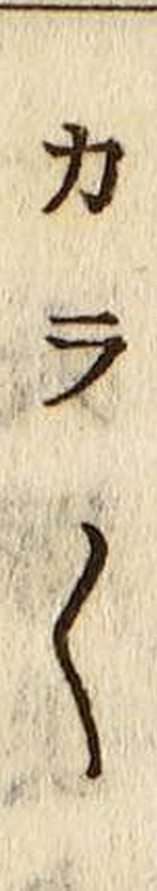カラ〳〵
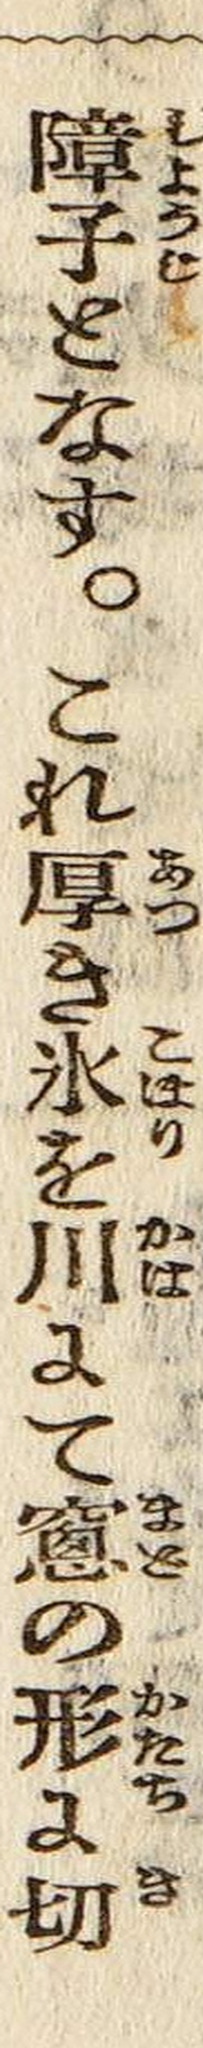障子となす。これ厚き氷を川にて窓の形に切
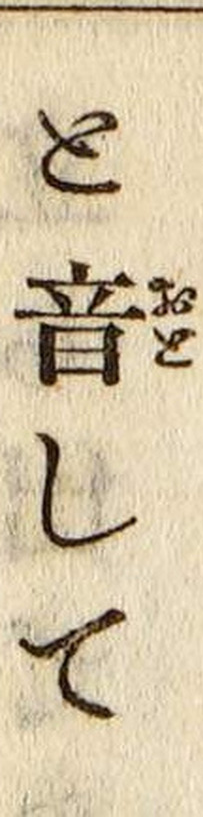と音して
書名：日本漂流譚
